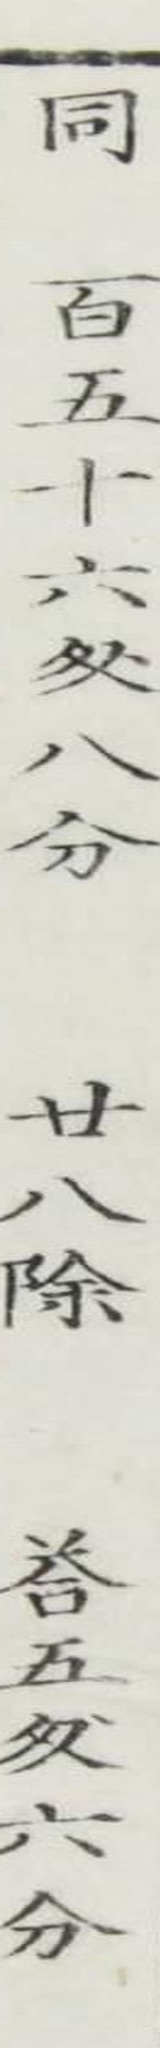同百五十六匁八分廿八除答五匁六分
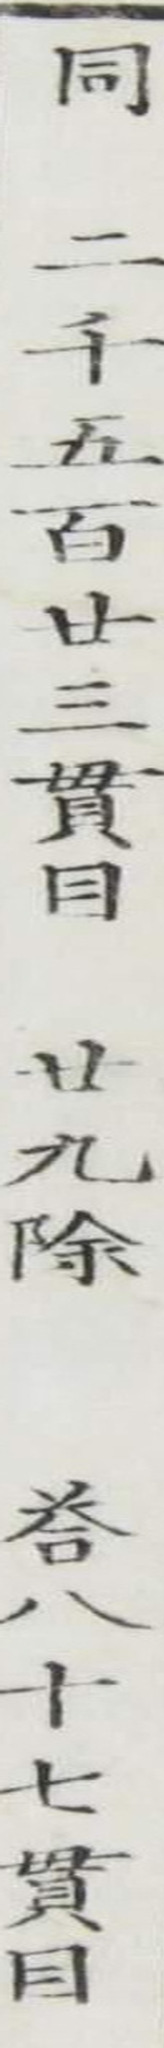同二千五百廿三貫目廿九除答八十七貫目
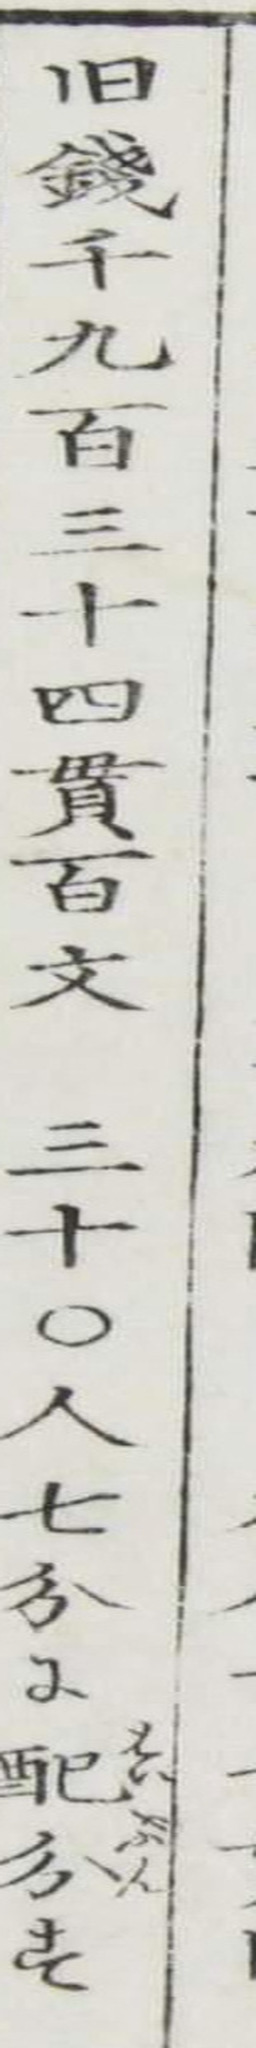旧銭千九百三十四貫百文三十〇人七分に配分す
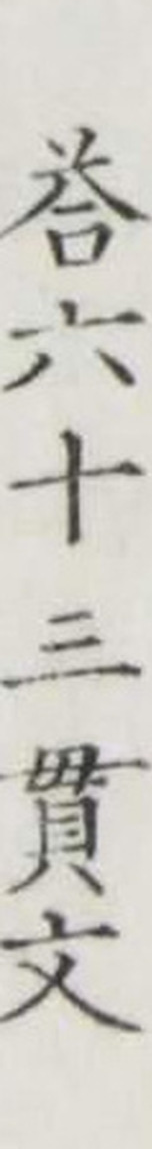答六十三貫文
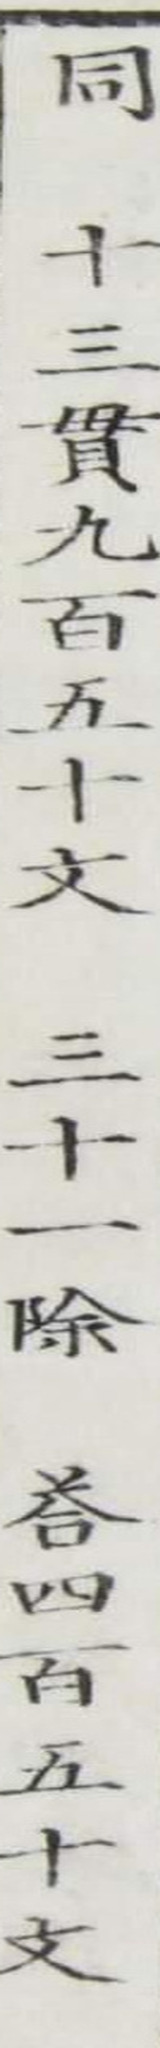同十三貫九百五十文三十一除答四百五十文
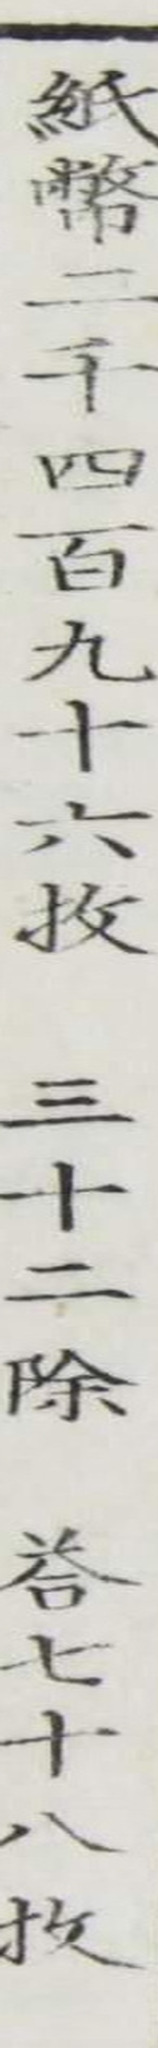紙幣二千四百九十六枚三十二除答七十八枚
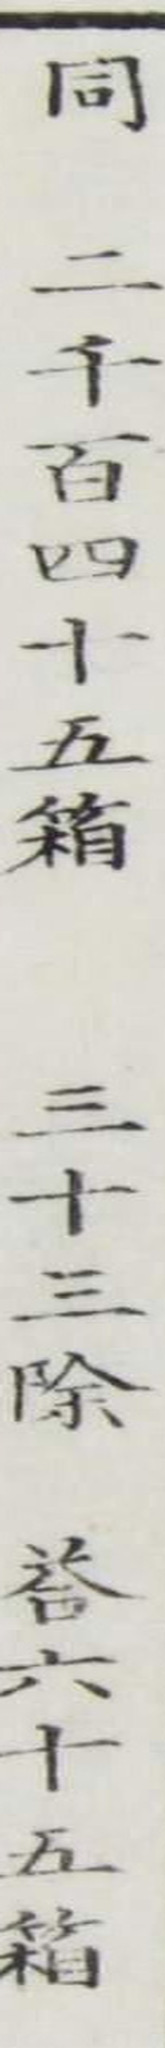同二千百四十五箱三十三除答六十五箱
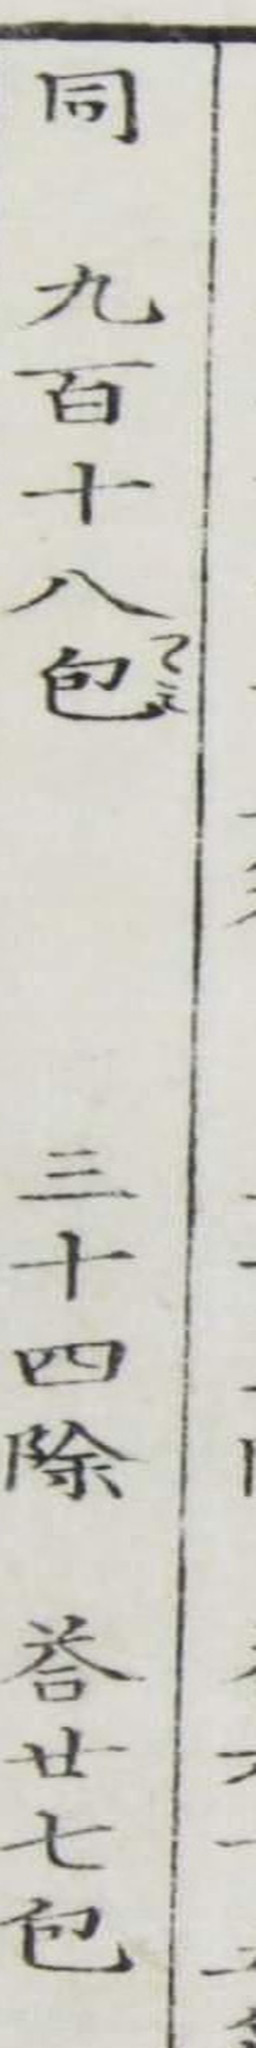同九百十八包三十四除答廿七包
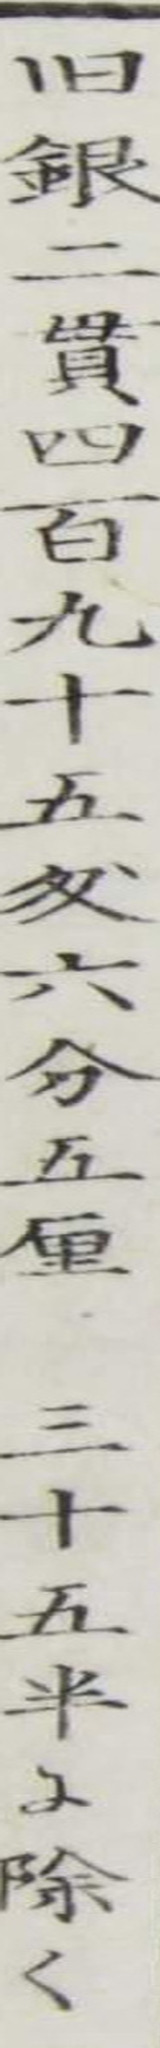旧銀二貫四百九十五匁六分五厘三十五半に除く

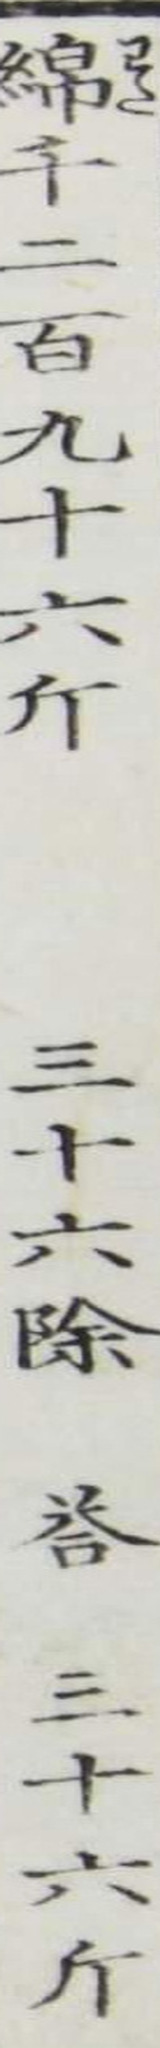綿千二百九十六斤三十六除答三十六斤
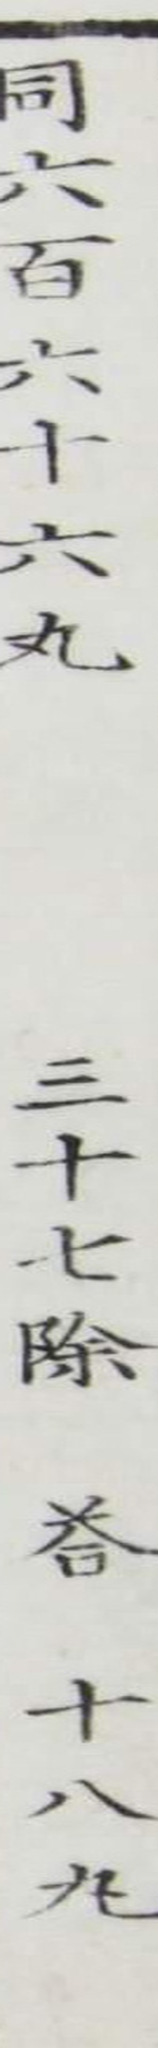同六百六十六丸三十七除答十八丸
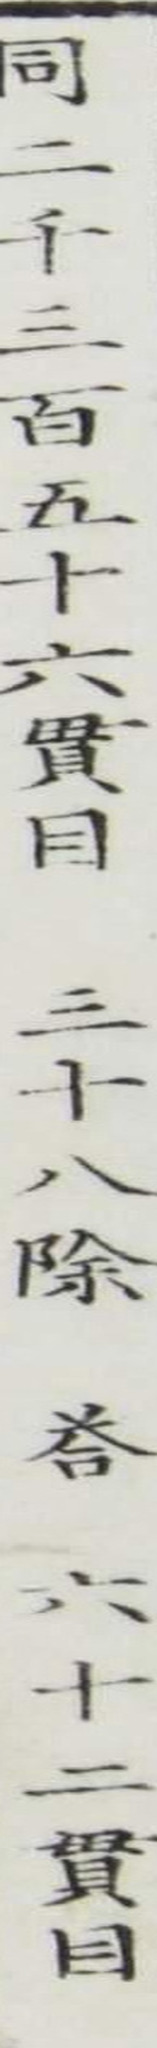同二千三百五十六貫目三十八除答六十二貫目
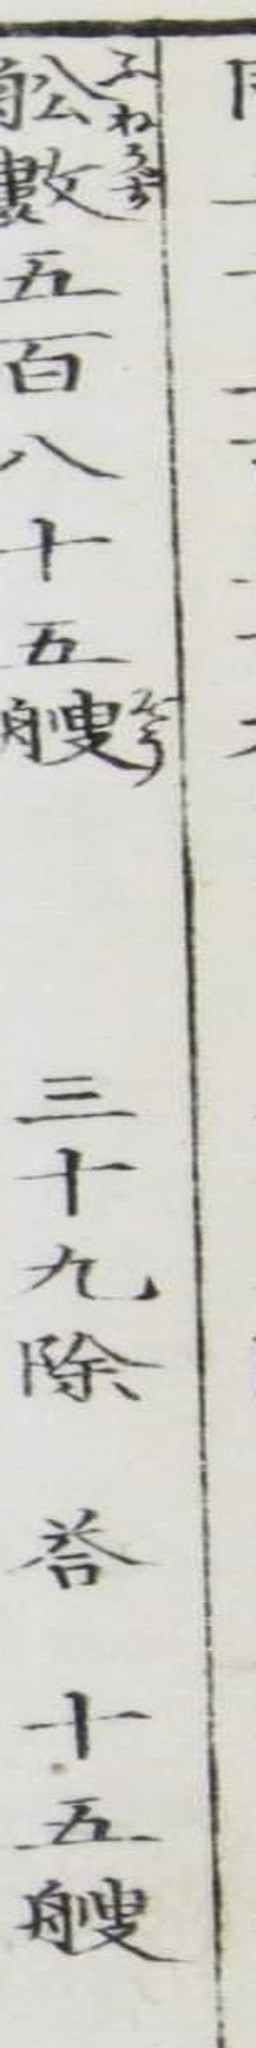船数五百八十五艘三十九除答十五艘
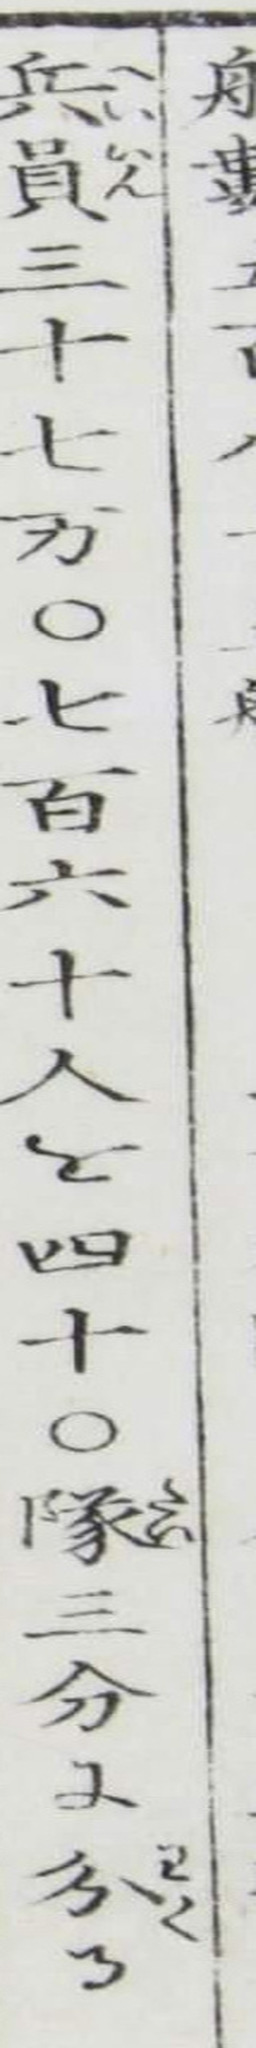兵員三十七万〇七百六十人を四十〇隊三分に分る
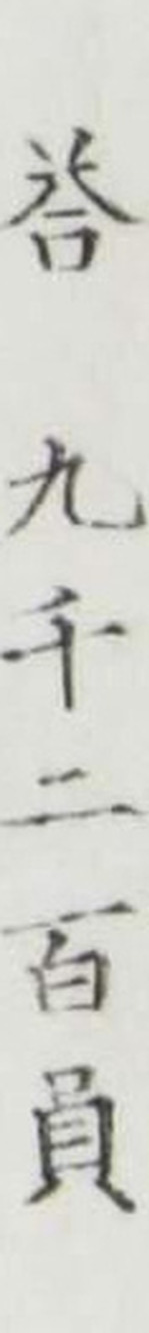答九千二百員
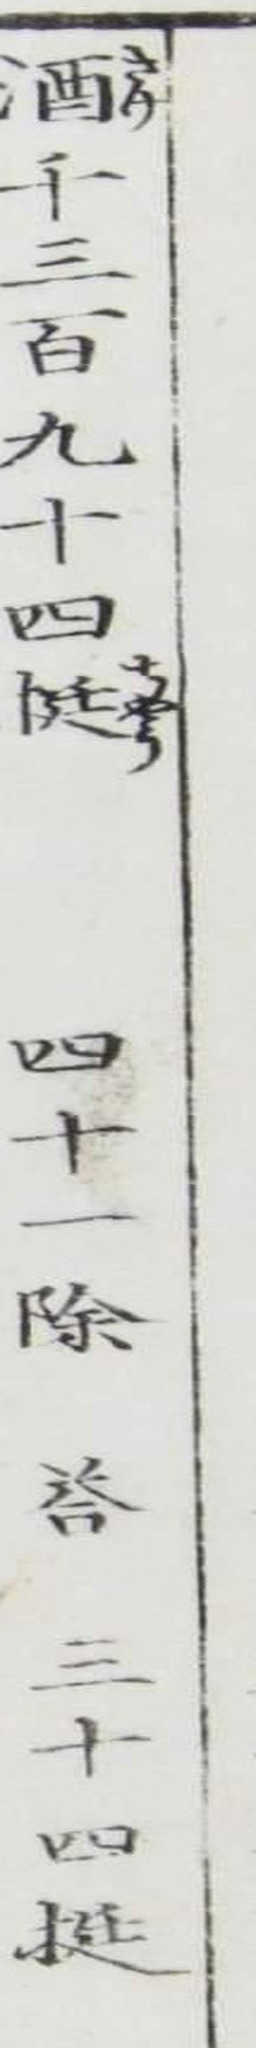酒千三百九十四挺四十一除答三十四挺
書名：明治小學塵劫記 卷1
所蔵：東京学芸大学教育コンテンツアーカイブ
